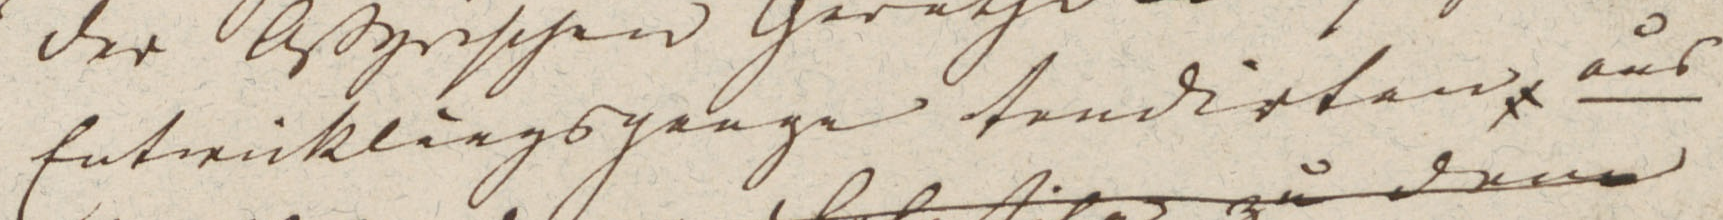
Entwicklungsgange tendirten, aus
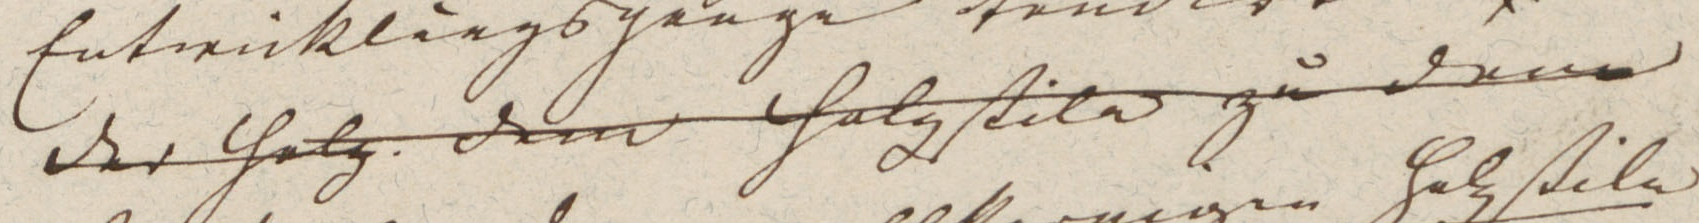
der Holz dem Holzstile zu dem
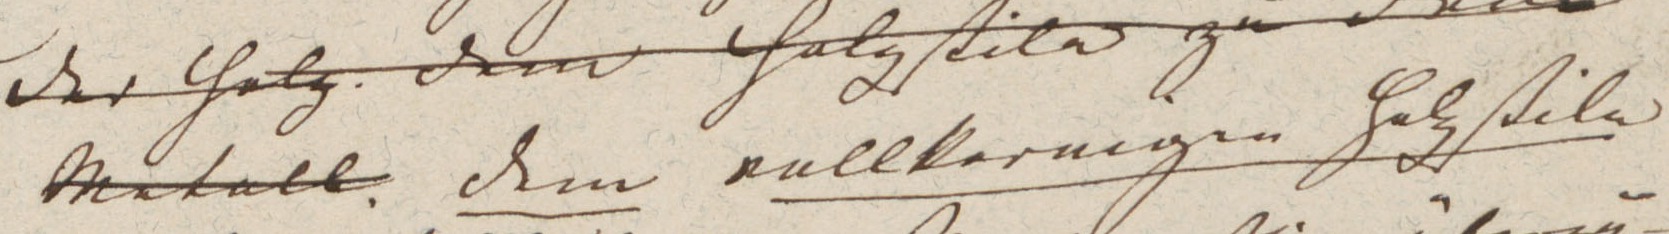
Metall dem vollkernigen Holzstile
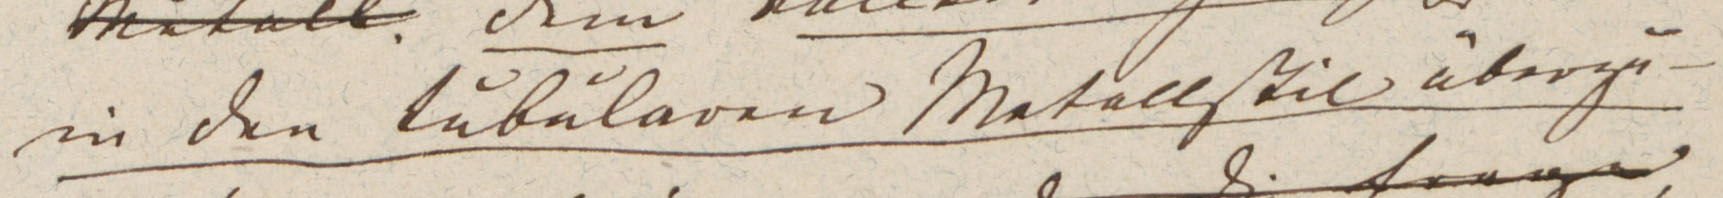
in den tubularen Metallstil überzu-
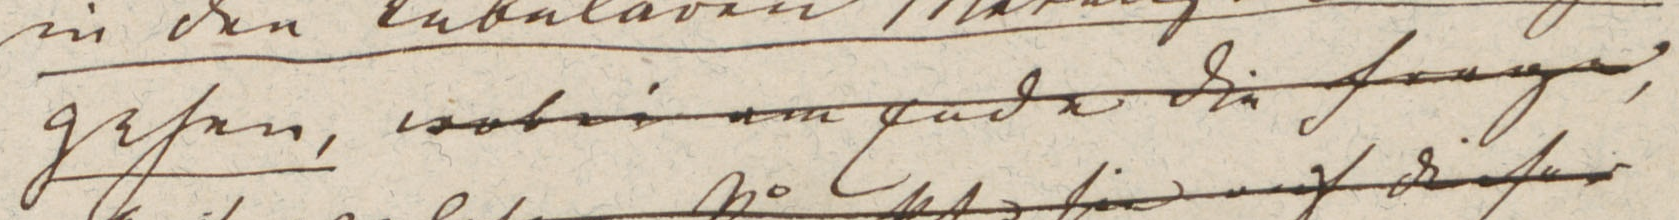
gehen, wobei am Ende die Frage,
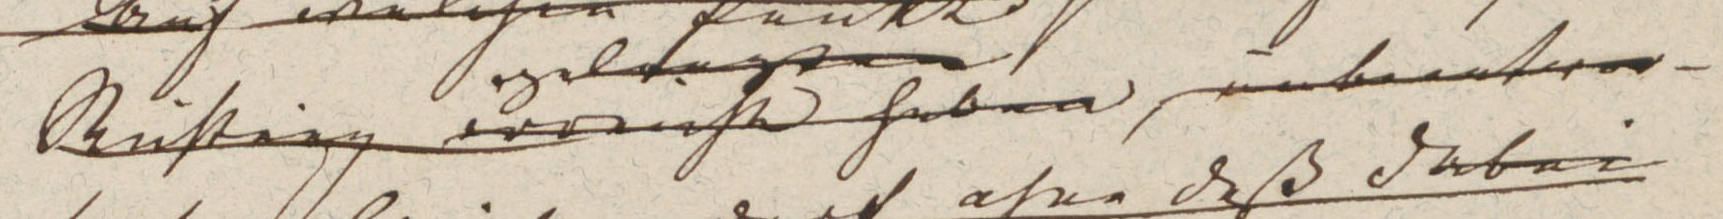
Richtung erreicht haben gelangten, unbeantwor-
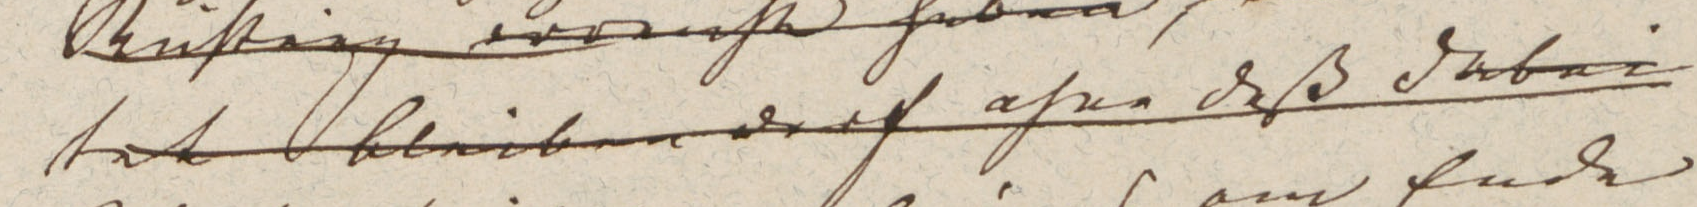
tet bleiben darf ohne dass dabei
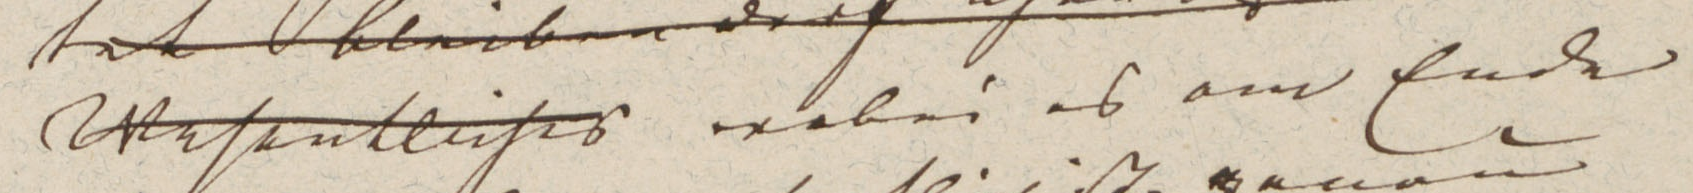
Wesentliches wobei es am Ende
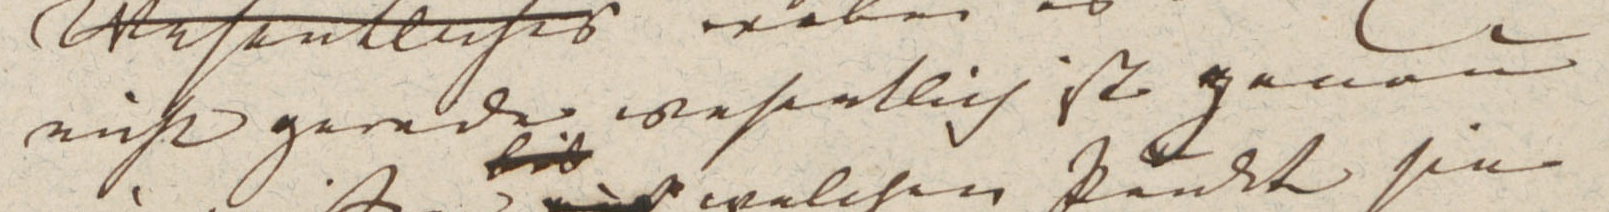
nicht gerade wesentlich ist genau
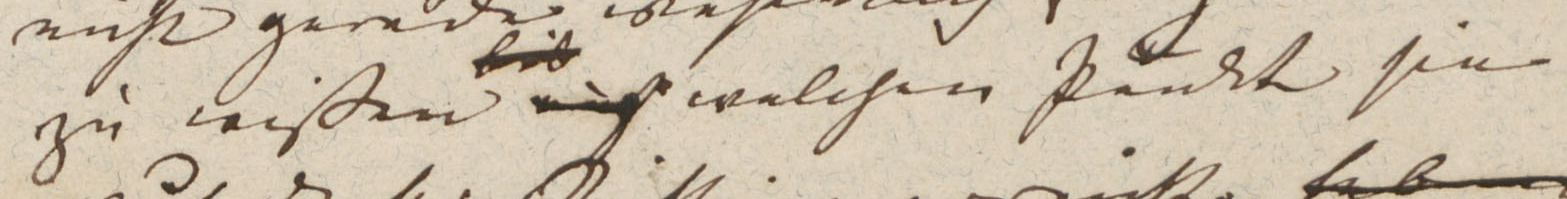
zu wissen auf bis welchen Punkt sie
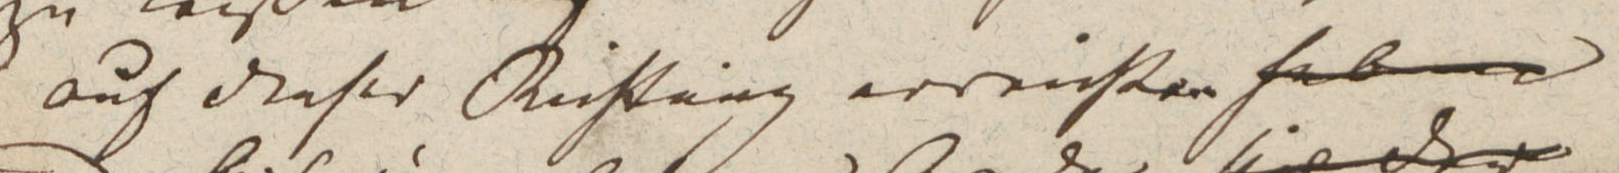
auf dieser Richtung erreichten haben
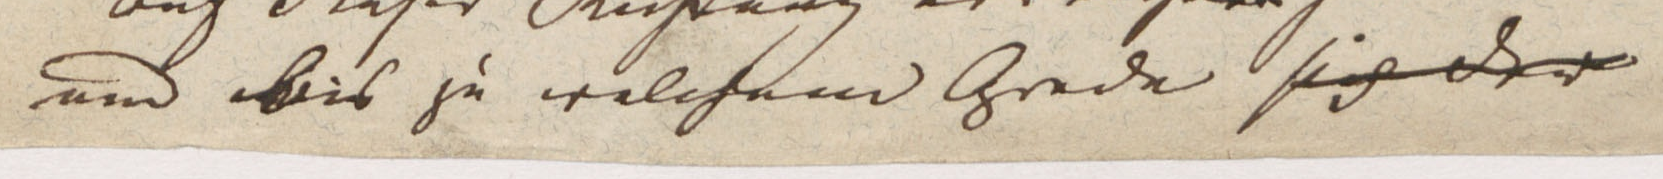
und bis zu welchem Grade sich der
